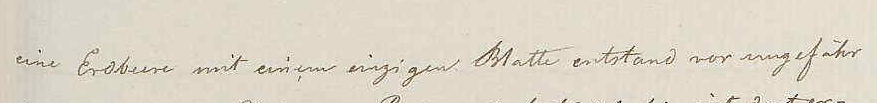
eine Erdbeere mit einem einzigen Blatte entstand vor ungefähr
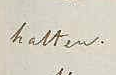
halten.
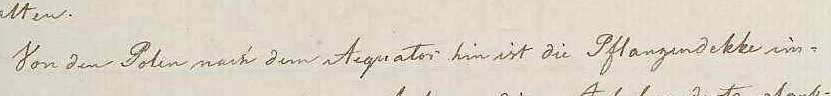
Von den Polen nach dem Aequator hin ist die Pflanzendekke im-
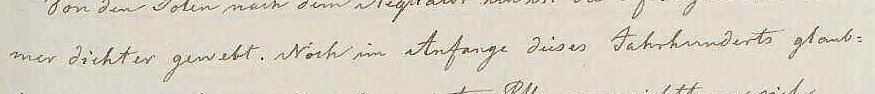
mer dichter gewebt. Noch im Anfange dieses Jahrhunderts glaub-
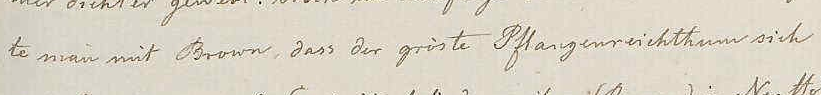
te man mit Brown, dass der gröste Pflanzenreichthum sich
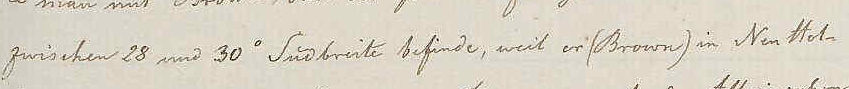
zwischen 28 und 30° Südbreite befinde, weil er in Neu Hol-
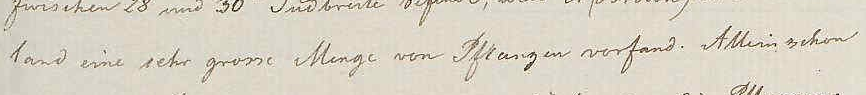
land eine sehr grosse Menge von Pflanzen vorfand. Allein schon
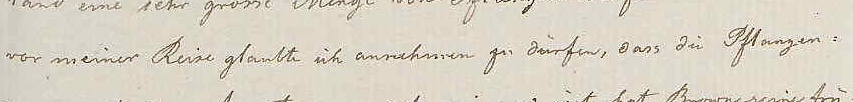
vor meiner Reise glaubte ich annehmen zu dürfen, dass die Pflanzen-
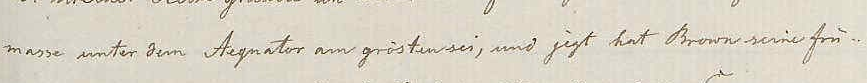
masse unter dem Aequator am grösten sei, und jezt hat Brown seine frü-
